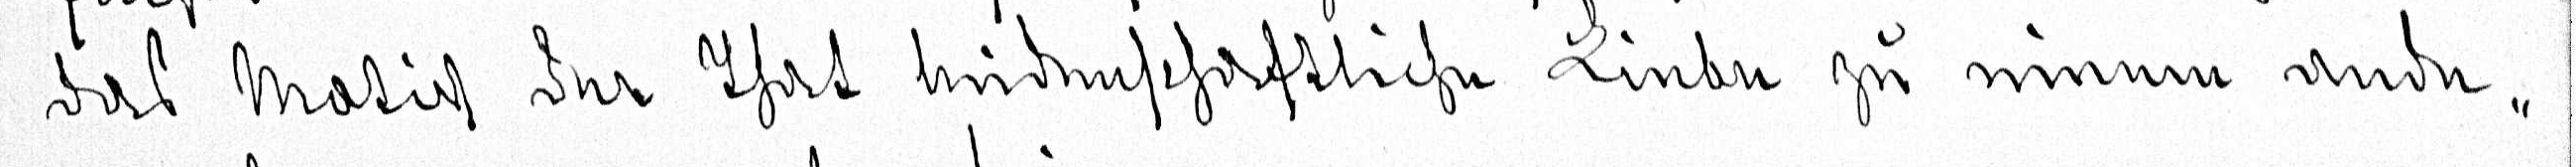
das Motiv der That leidenschaftliche Liebe zu einem ande¬
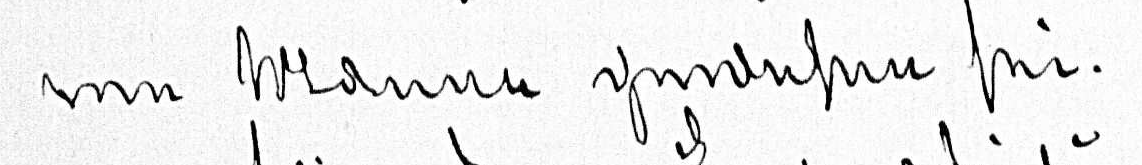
ren Manne gewesen sei.
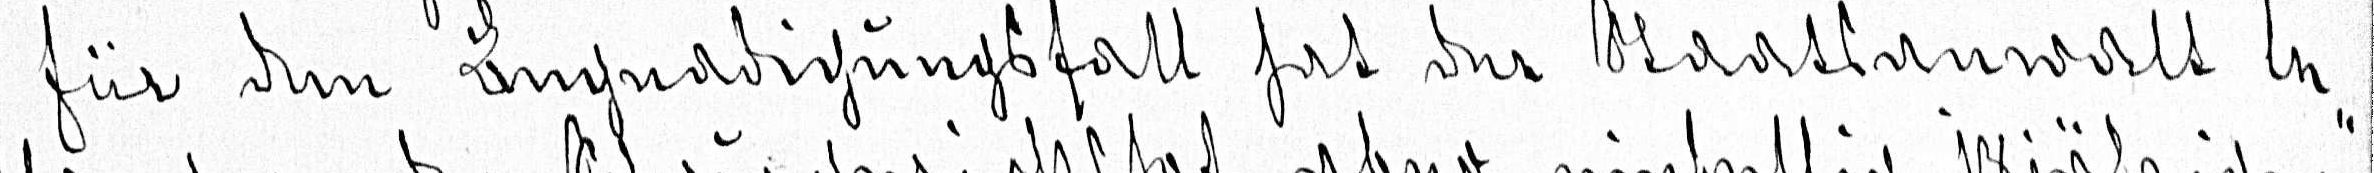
Für den Begnadigungsfall hat der Staatsanwalt le¬
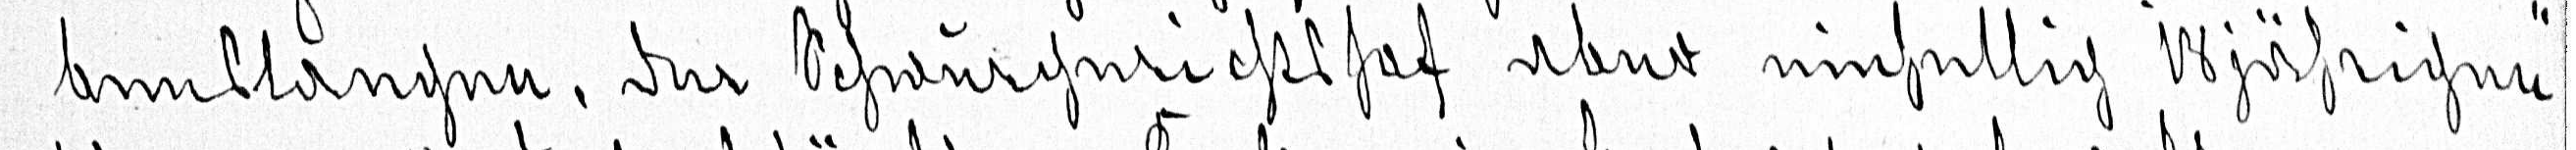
benslangen, der Schwurgerichtshof aber einhellig 18jährigen
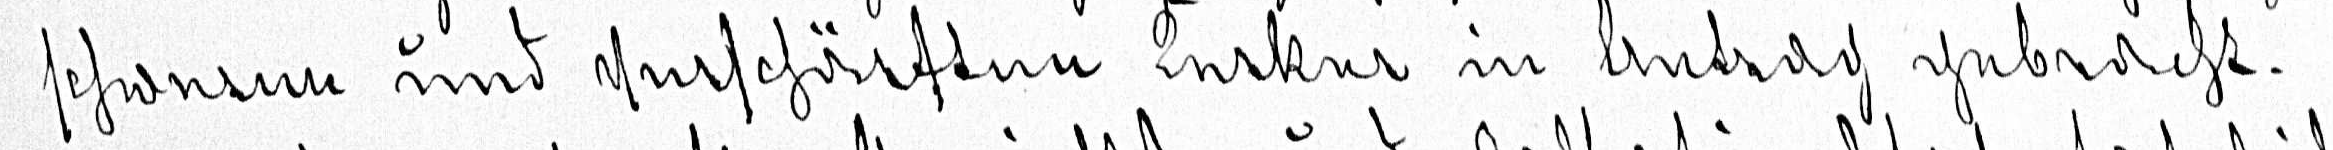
schweren und verschärften Kerker in Antrag gebracht.
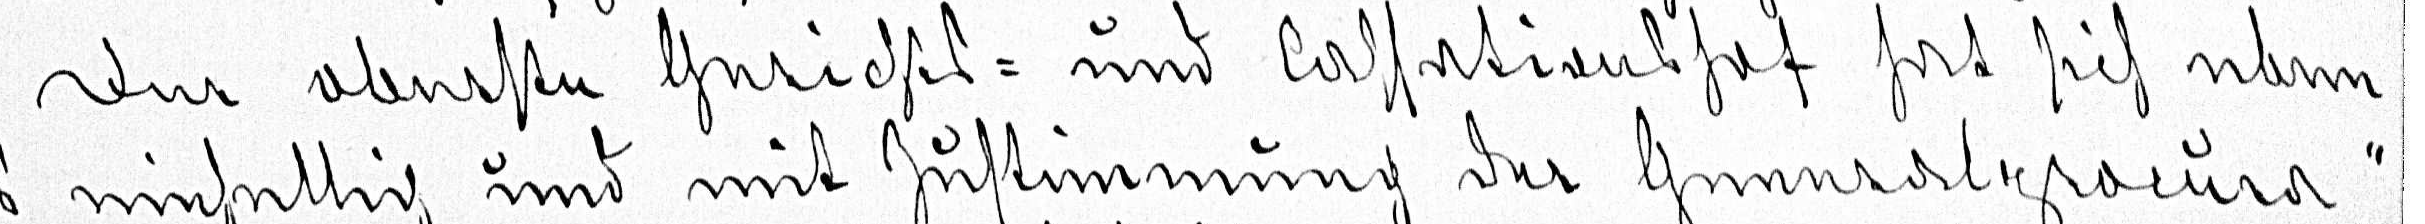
Der oberste Gerichts- und Cassationshof hat sich eben¬
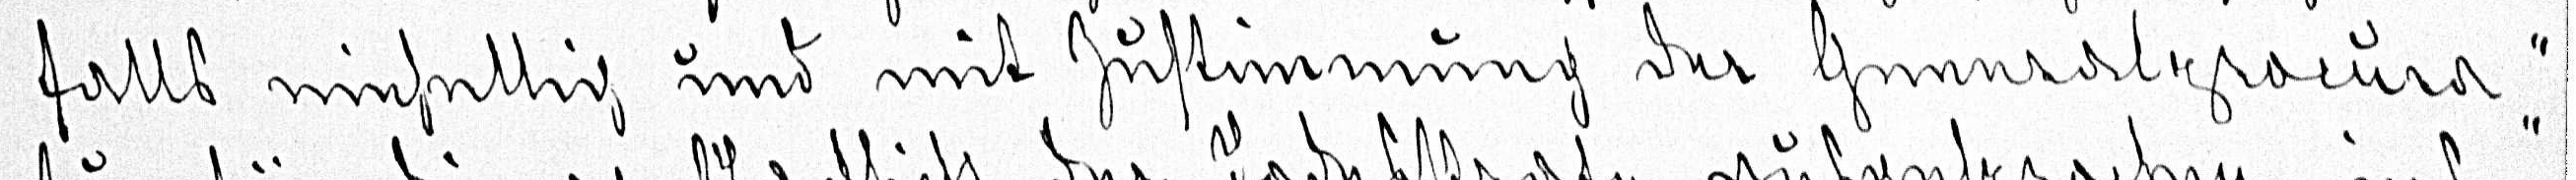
falls einhellig und mit Zustimmung der Generalprocura¬
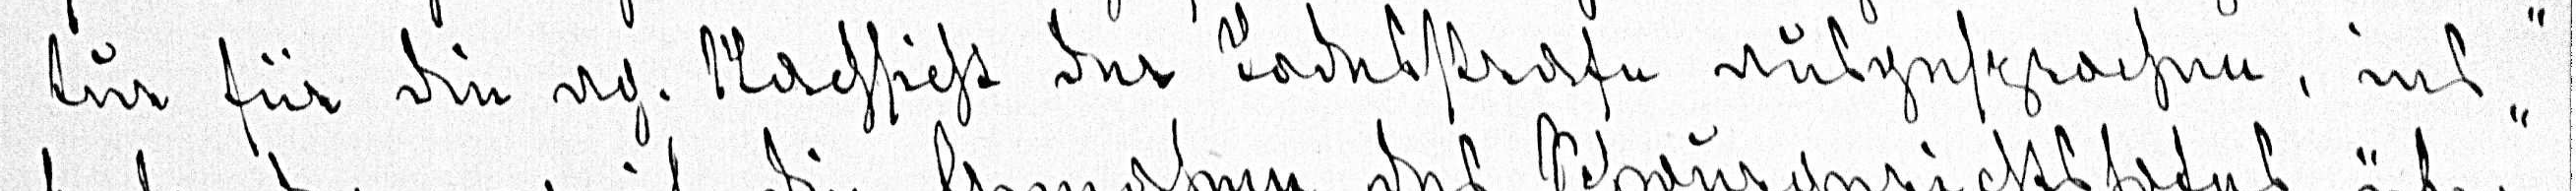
tur für die ag. Nachsicht der Todesstrafe ausgesprochen, ins¬
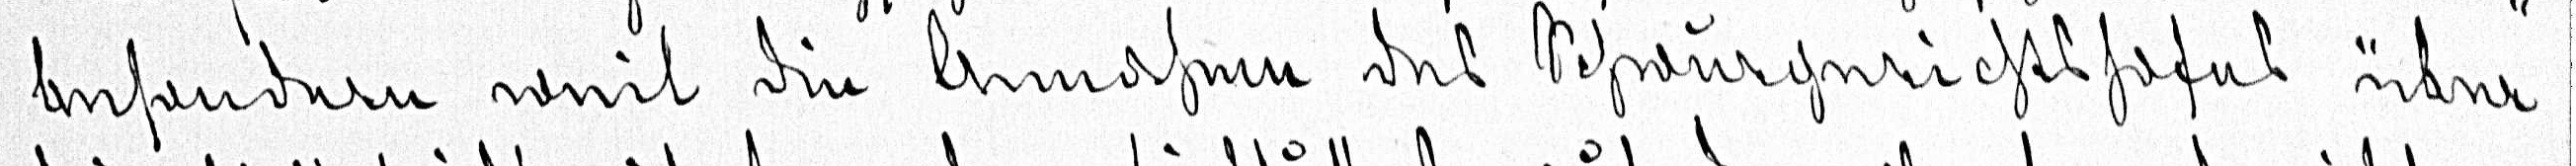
besondere weil die Annahme des Schwurgerichtshofes über
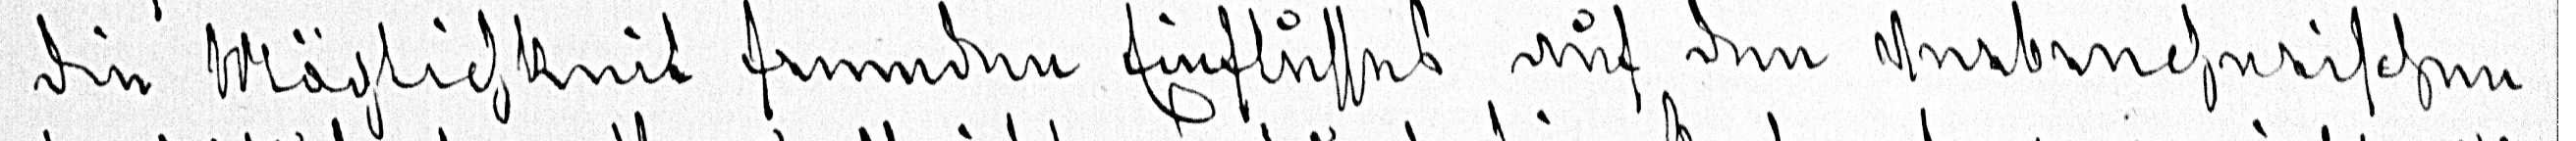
die Möglichkeit fremden Einflusses auf den Verbrecherischen
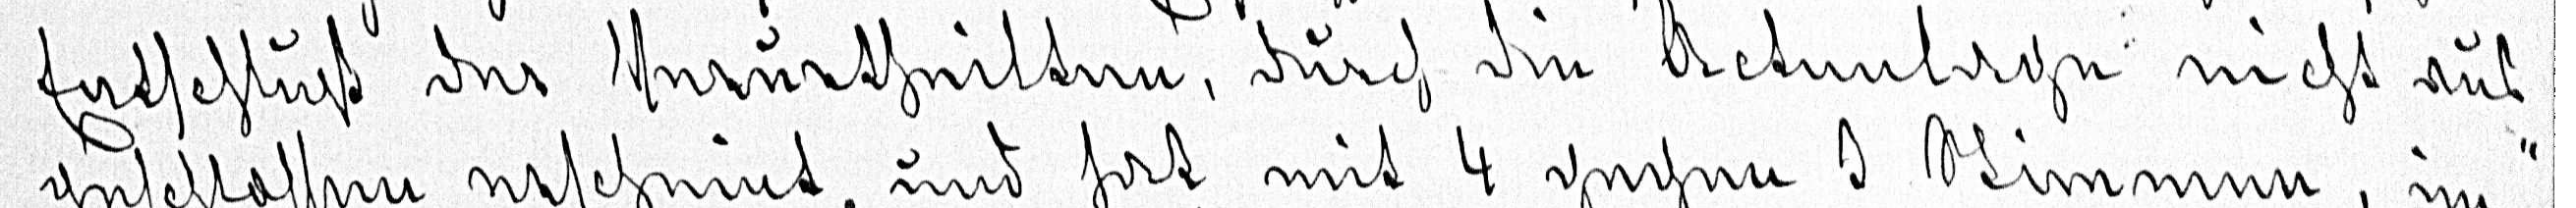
Entschluß der Verurtheilten, durch die Actenlage nicht aus¬
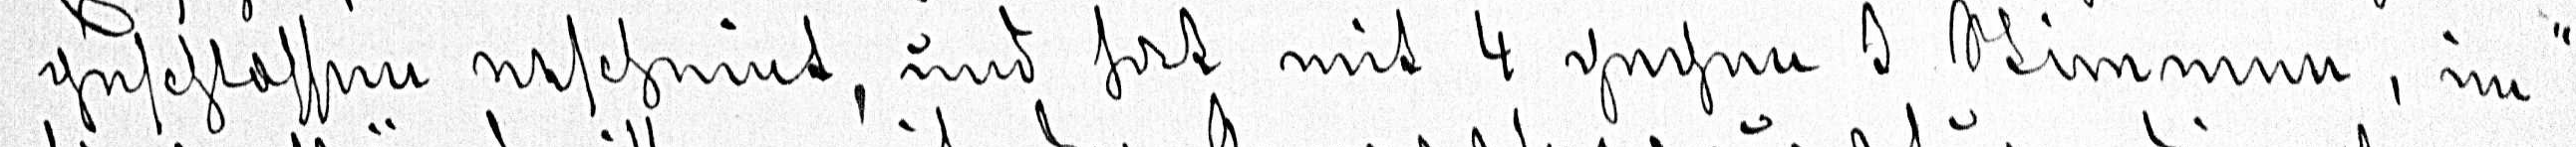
geschlossen erscheint, und hat mit 4 gegen 3 Stimmen, im
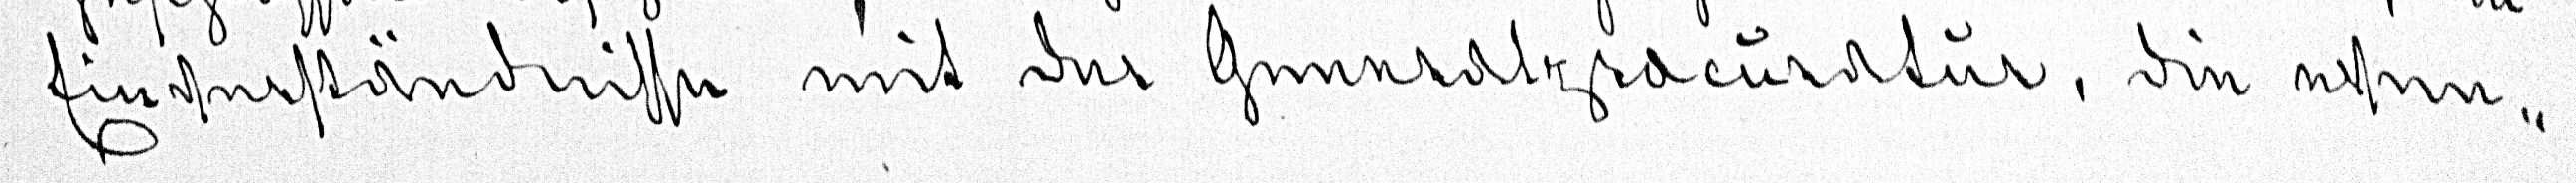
Einverständnisse mit der Generalprocuratur, die even¬
